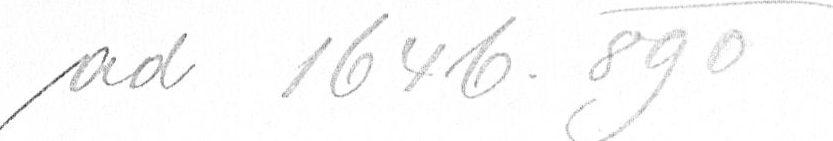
ad 1746.890
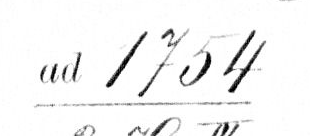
ad 1754/
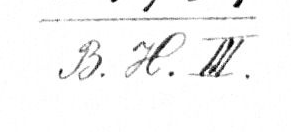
B. H. III.
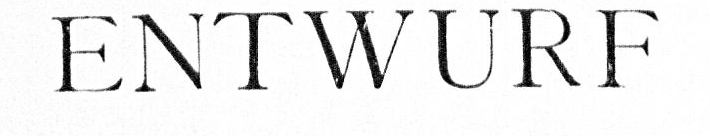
ENTWURF
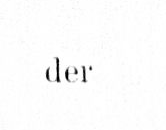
der
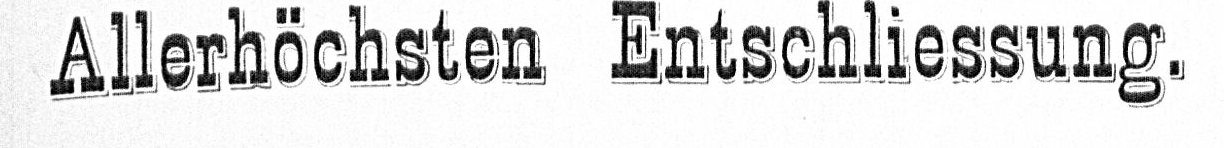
Allerhöchsten Entschliessung.
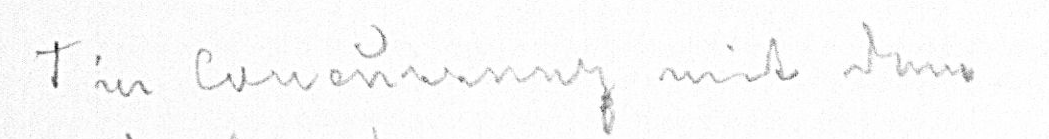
in Concurrenz mit dem
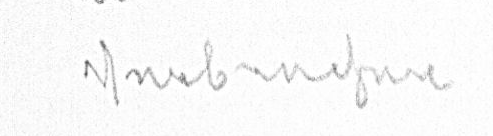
Verbrechen
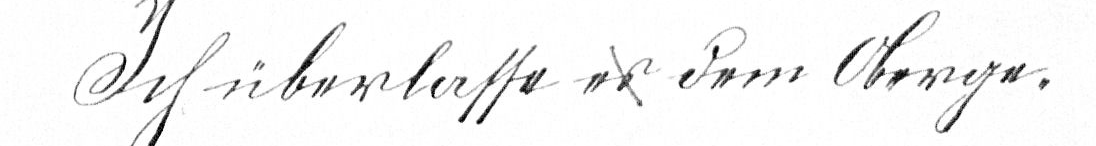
Ich überlasse dem Oberge¬
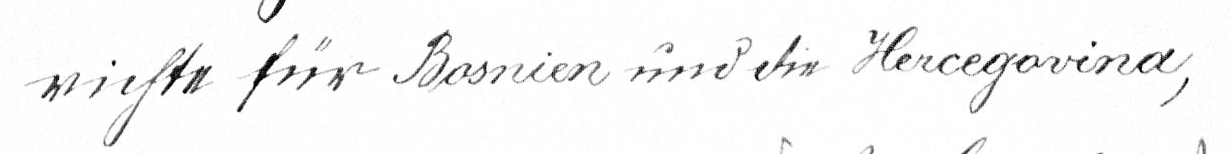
richte für Bosnien und die Hercegovina,
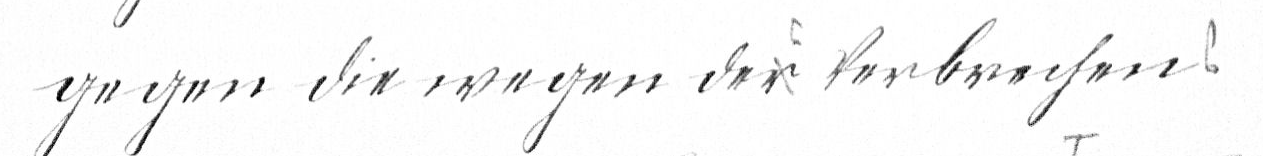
gegen die wegen des Verbrechens
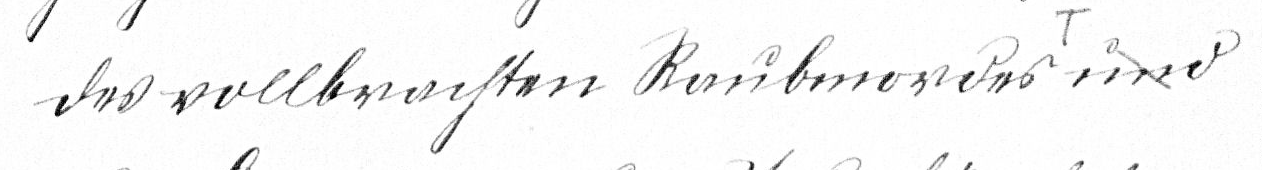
des vollbrachten Raubmordes
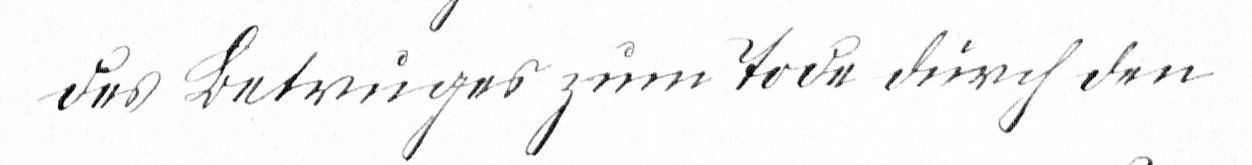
des Betruges zum Tode durch den
